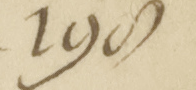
198
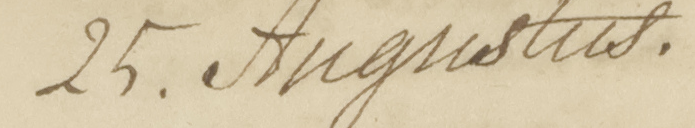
25. Augustus.
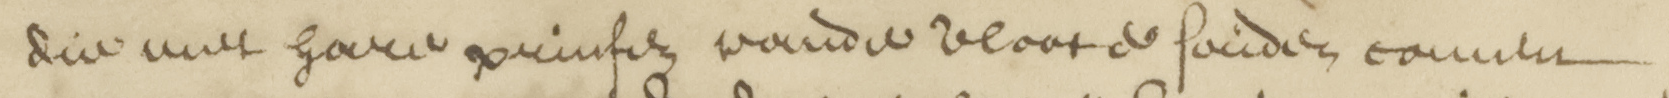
die met hare prinsen vande vloote souden comen
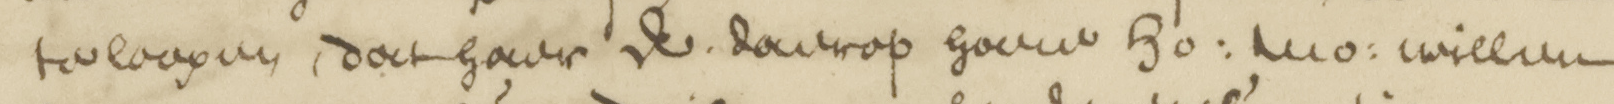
te loopen, dat haer E. daerop hare Ho:Mo: willen
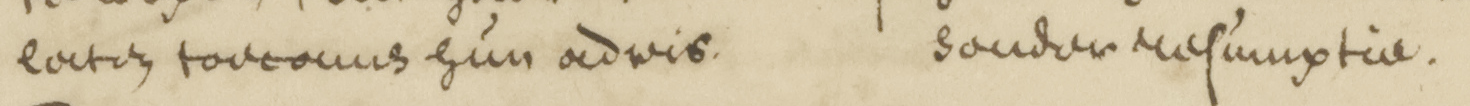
laten toecomen hun advis. sonder resumptie.
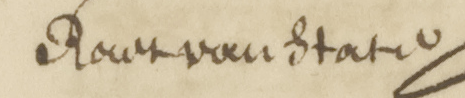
Raet van State
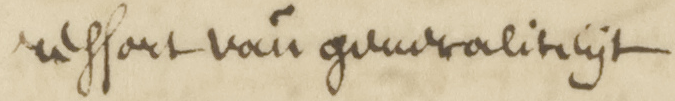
ressort van Generaliteijt
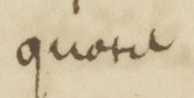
quote
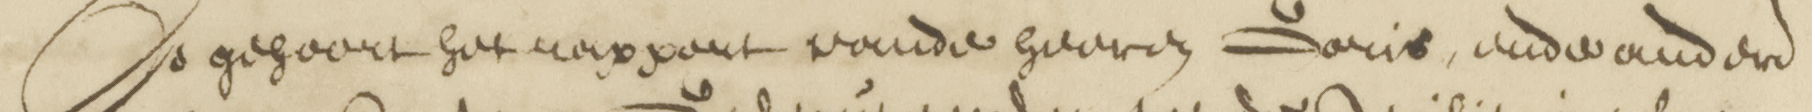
Is gehoort het rappert vande heeren Goris, ende andere
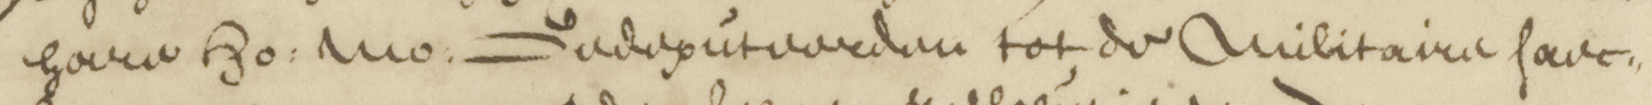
hare Ho:Mo: Gedeputeerden tot de Militaire saec„
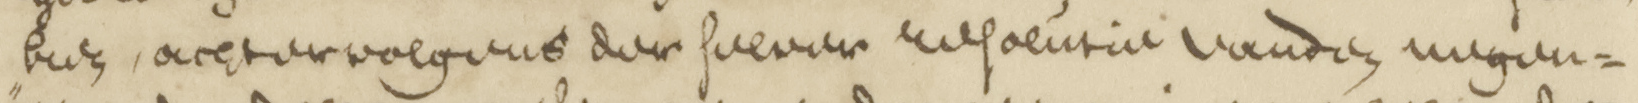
,,ken, achtervolgens der selver resolutie vanden negen„
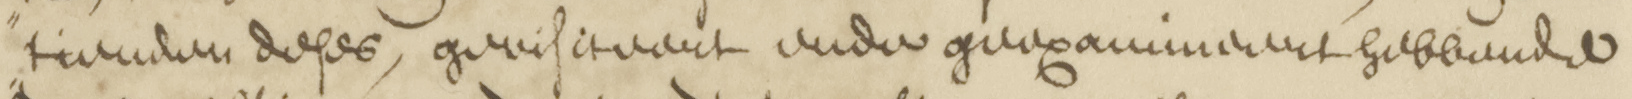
tienden deses, gevisiteert ende geexamineert hebbende
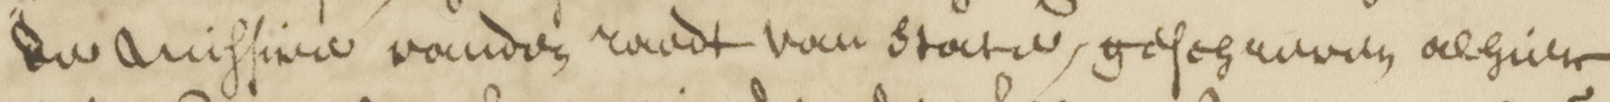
de missive vanden raedt van State, geschreven alhier
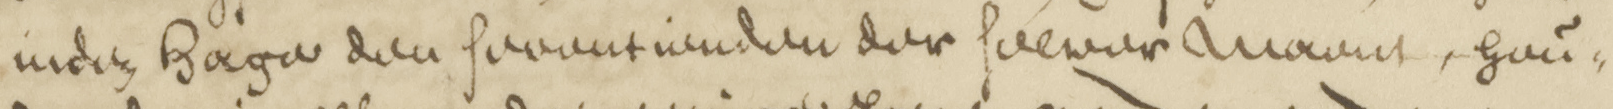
inden Hage den seventienden der selver Maent, hou„
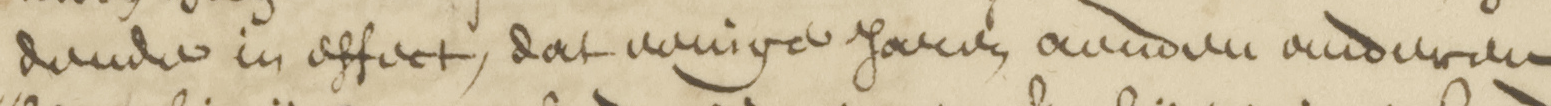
,,dende in effect, dat eenige Jaren aenden anderen
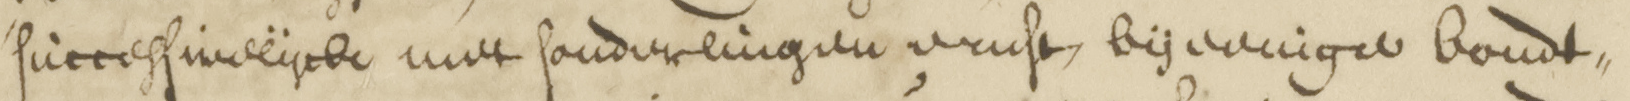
successivelijck met sonderlingen ernst, bij eenige bondt„
